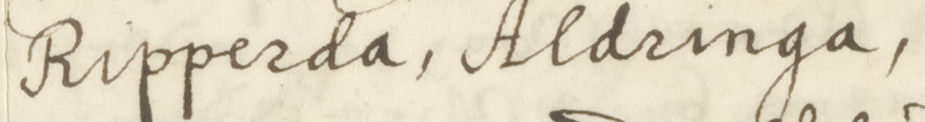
Ripperda, Aldringa.
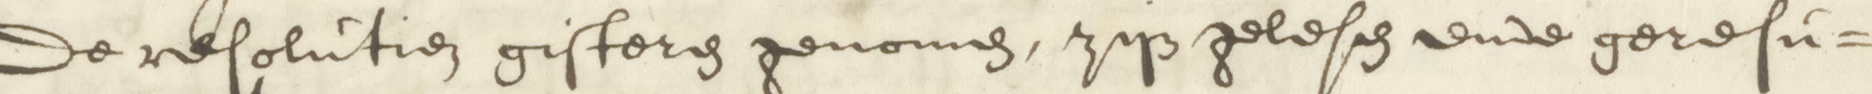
De resolutien gisteren genomen, zijn gelesen ende geresu„
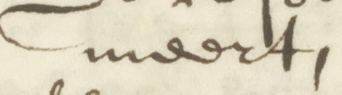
meert.
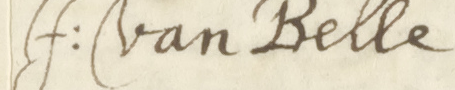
I: van Belle.
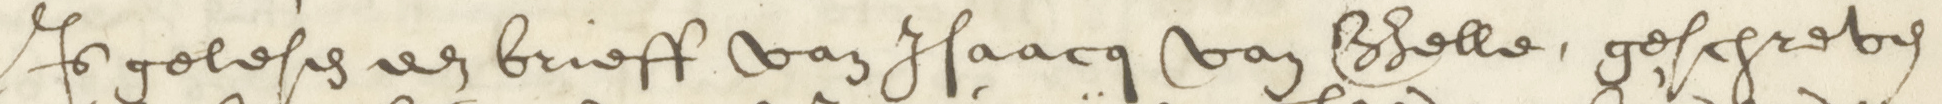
Is gelesen een brieff van Isaacq van Belle, geschreven
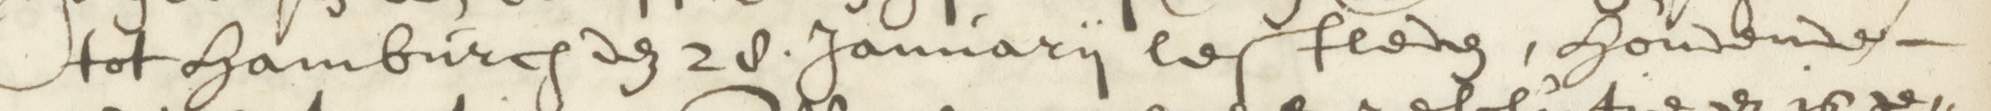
tot Hamburch den 28. Januarij lestleden, houdende -
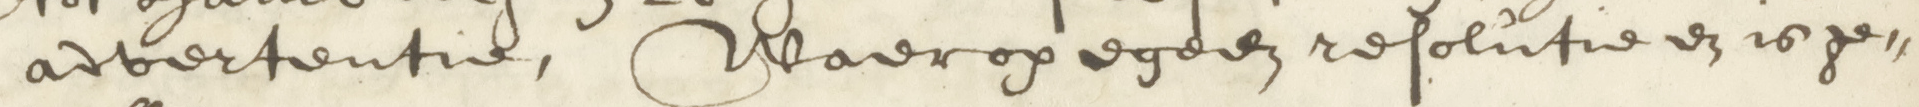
advertentie. Waer op egeen resolutie en is ge„
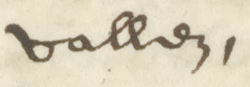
vallen.
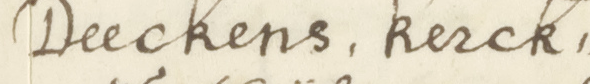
Deeckens, kerck„
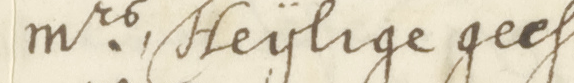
mrs., Heijlige geest„
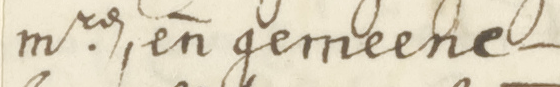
mren, en gemeene -
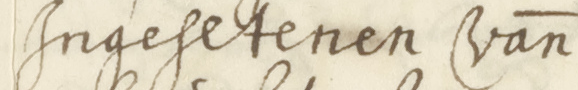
Ingesetenen van
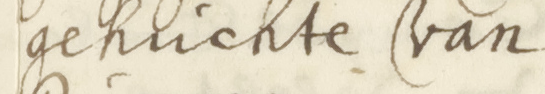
gehuchte van
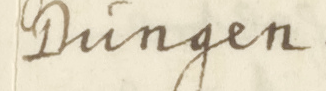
Dungen.
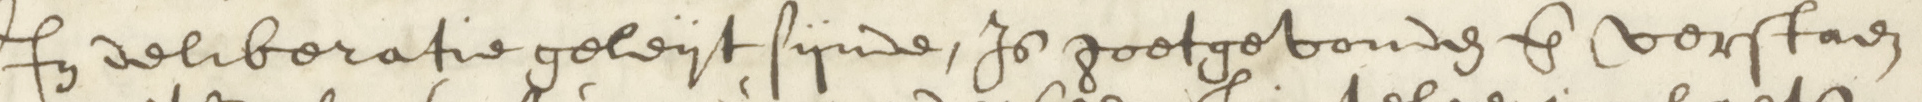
In deliberatie geleijt sijnde, Is goetgevonden & verstaen
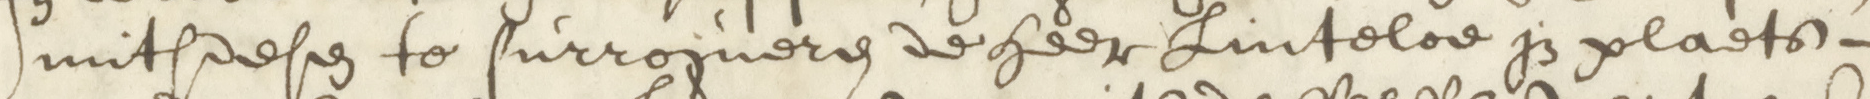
mitsdesen te surrogueren de heer Linteloe in plaets —
